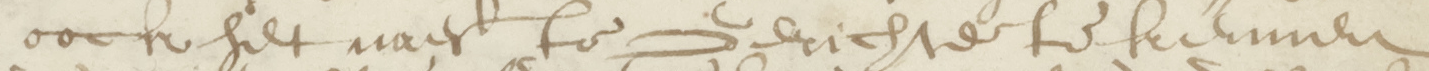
oock het naeste Gerichte te kennen
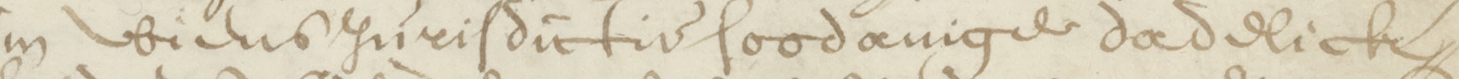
in wiens Jurisdictie soodanige dadelick„
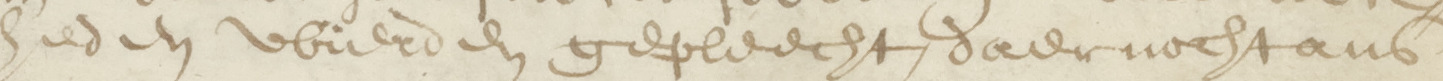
heden wierden gepleecht, daernochtans
